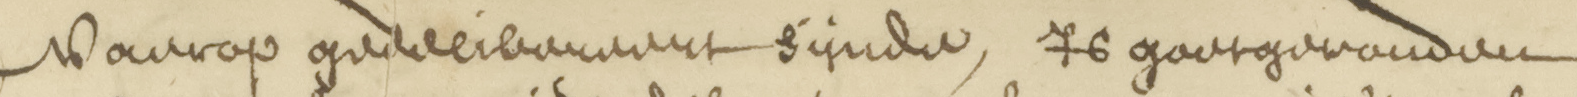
Waerop gedelibereert sijnde, Is goetgevonden
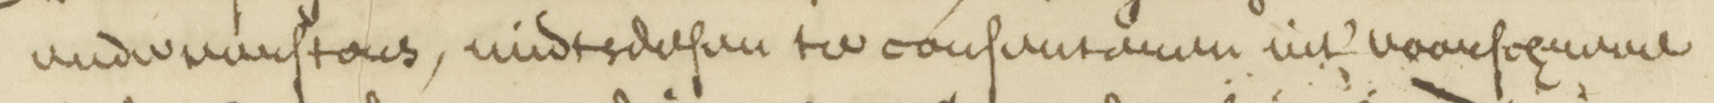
ende verstaen, midtsdesen te consenteren int' voorschreve
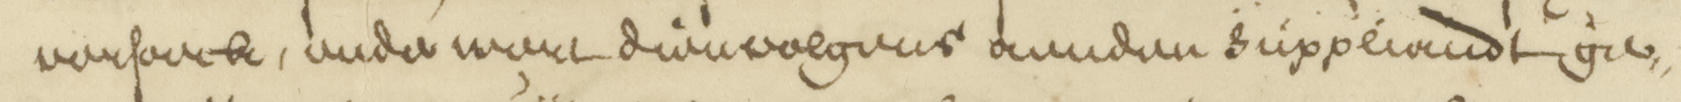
versoeck, ende wert dienvolgens aenden suppliandt ge„
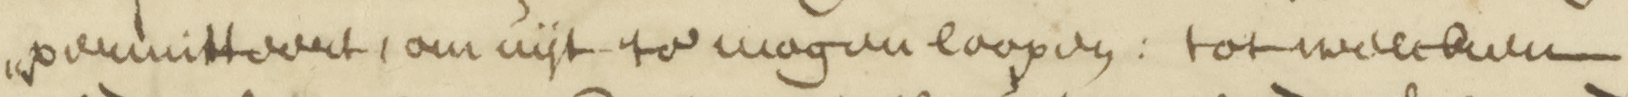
,,permitteert, om uijt te mogen loopen: tot welcken
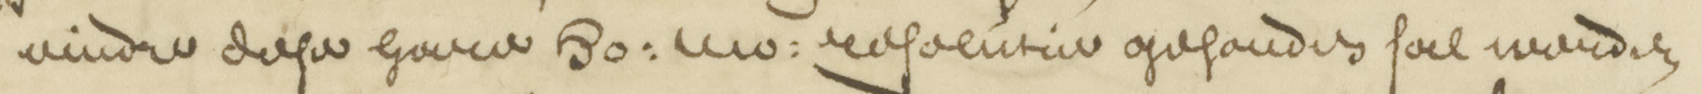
einde dese hare Ho:Mo: resolutie gesonden sal werden
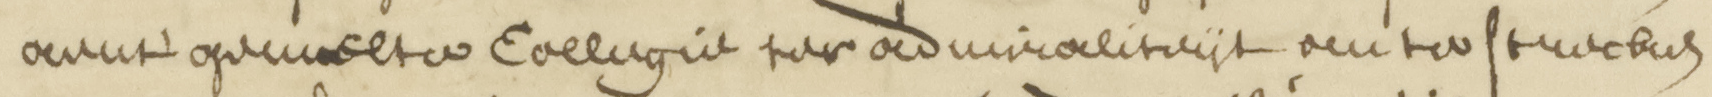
aent' gemelte Collegie ter Admiraliteijt om te strecken
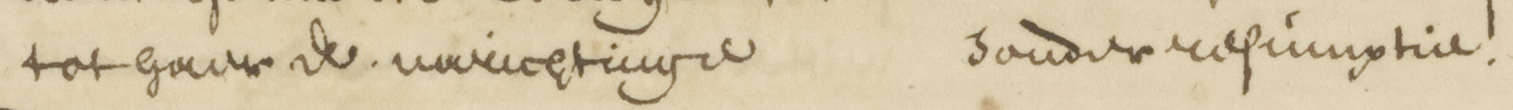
tot haer E. narichtinge sonder resumptie.
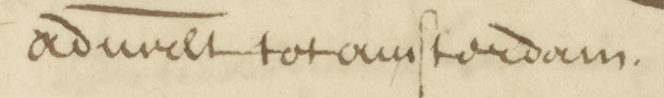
Admrlt tot Amsterdam
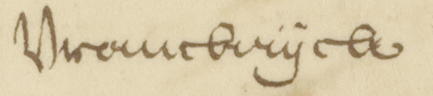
Vranckrijck
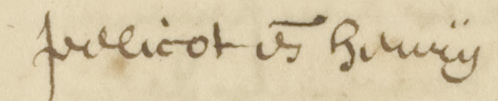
Pelicot en Henrij
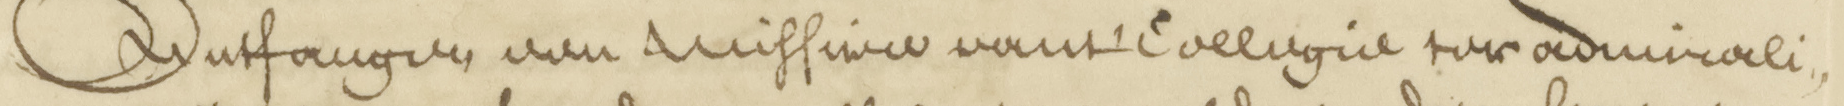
Ontfangen een missive vant' Collegie ter Admirali„
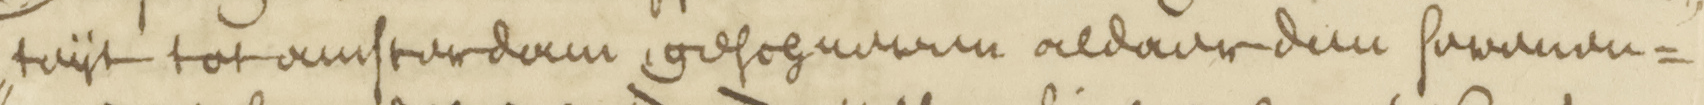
,,teijt tot Amsterdam geschreven aldaer den sevenen=
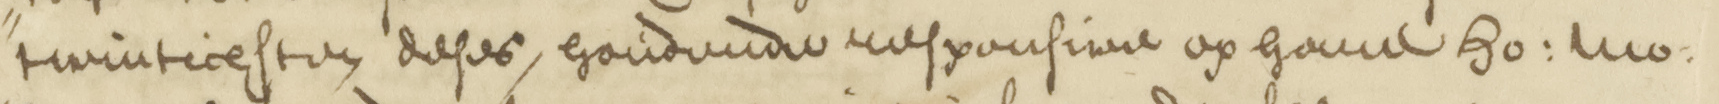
,,twintichsten deses, houdende responsive op hare Ho:Mo:
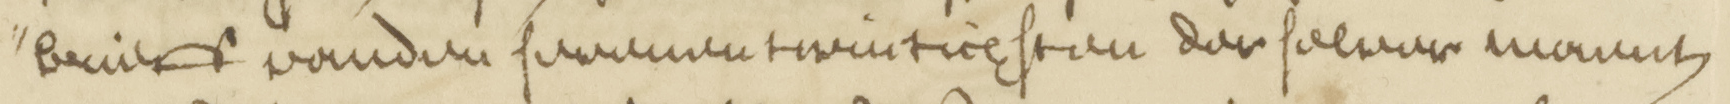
brieff vanden sevenentwintichsten der selver maent,
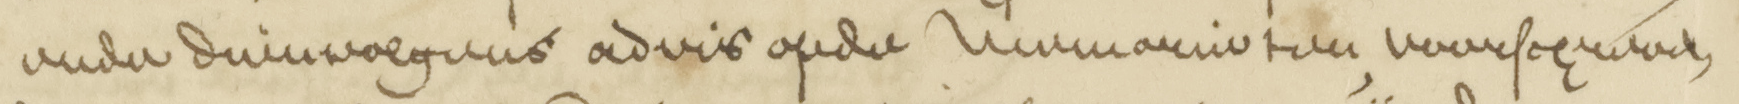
ende dienvolgens advis opde memorie ten voorschreven
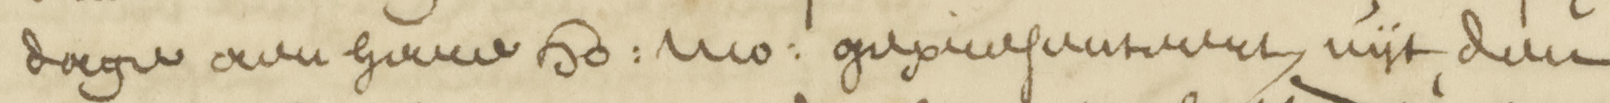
dage aen hare Ho:Mo: gepresenteert, uijt den
